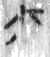六
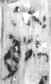○（擾）
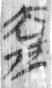盍（蓋）
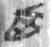西
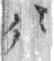北
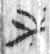之
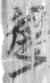遇（寓）
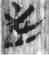芒（亡）
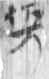倀（長）
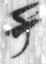子
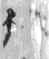北
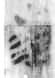南
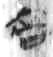高
